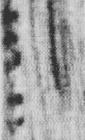樂
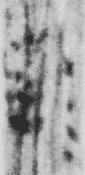爲
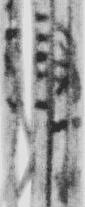甚
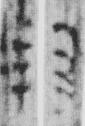甬（用）
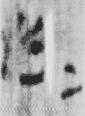身
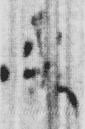之
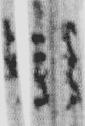弁
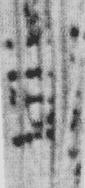者
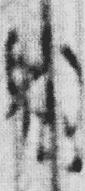悅
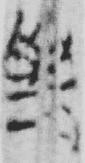爲
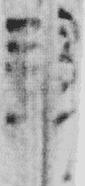甚
